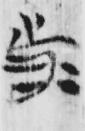之月
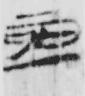亟（期）
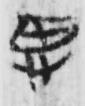思
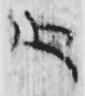少
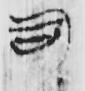司
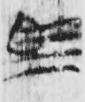馬
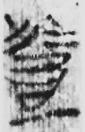登
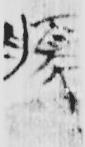蜀
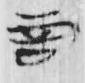言
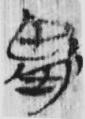{胃刀}（謂）
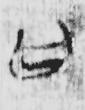甘
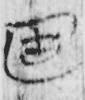固
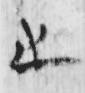之
